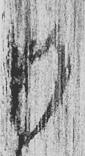死
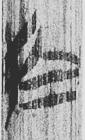於
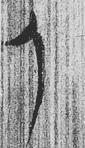人
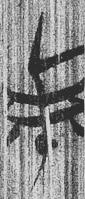手
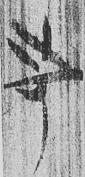先
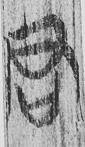君
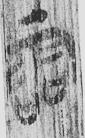霝（靈）
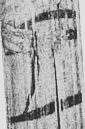王
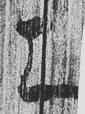云
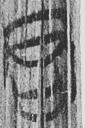君
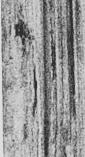人
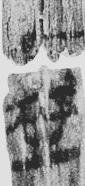者
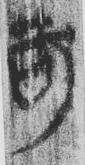可（何）
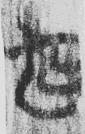必
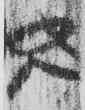𡚦
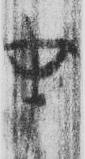才（哉）
